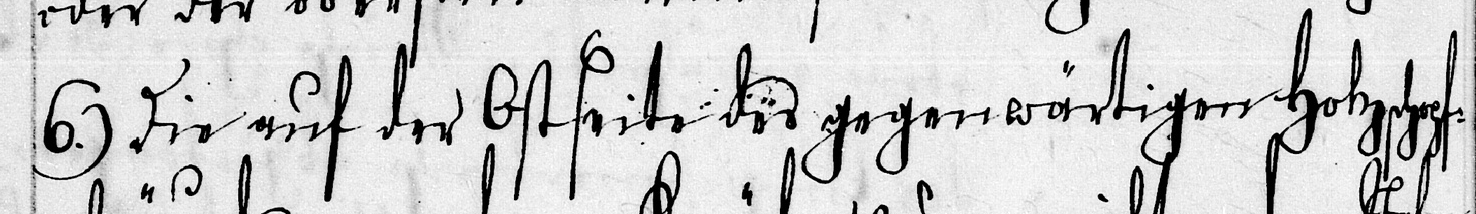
6.) Die auf der Ostseite des gegenwärtigen Holzscho¬
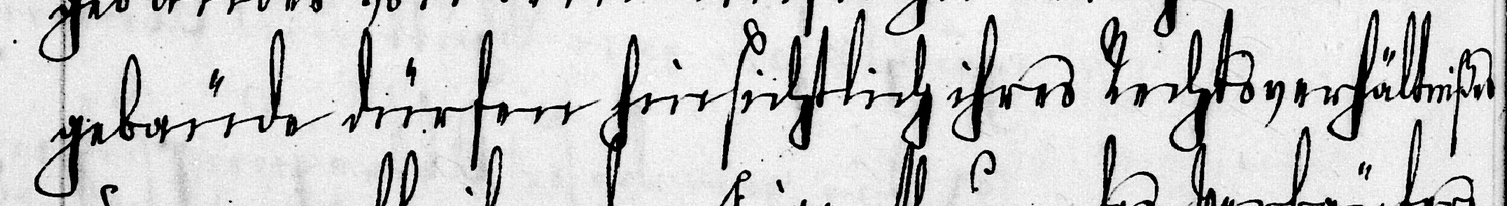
gebäude dürfen hinsichtlich ihres Rechtsverhältn¬
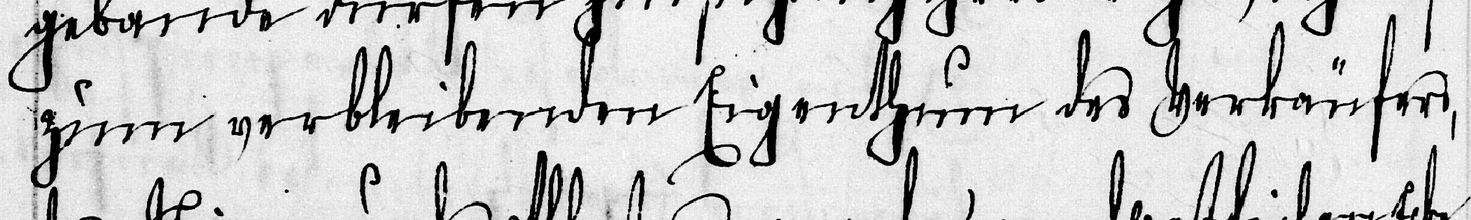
zum verbleibenden Eigenthum des Verkäufers,
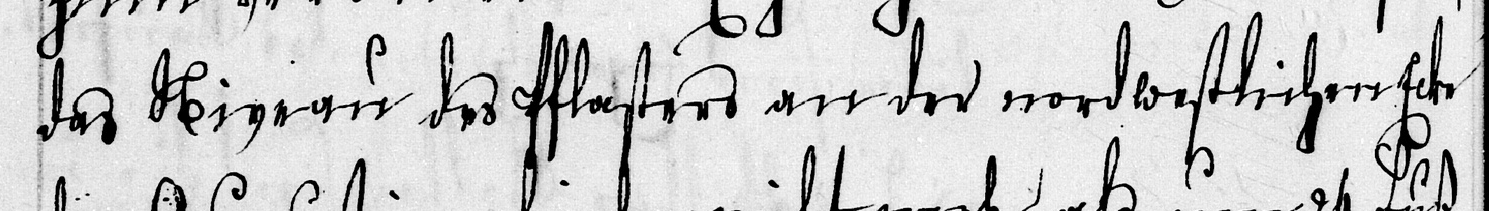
das Niveau des Pflasters an der nordwestlichen Ecke
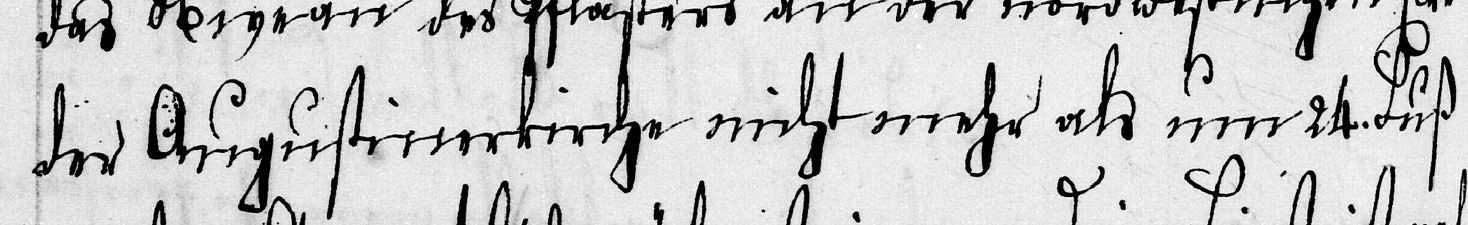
der Augustinerkirche nicht mehr als um 24. Fuß
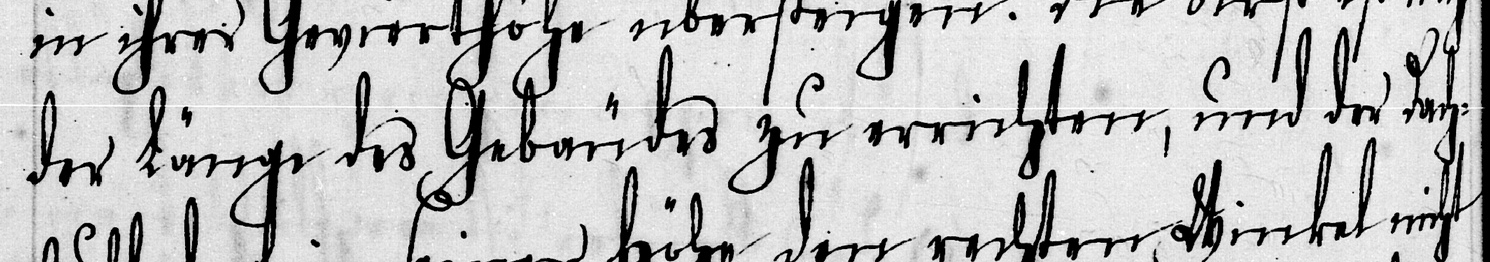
der Länge des Gebäudes zu errichten, und der Da¬
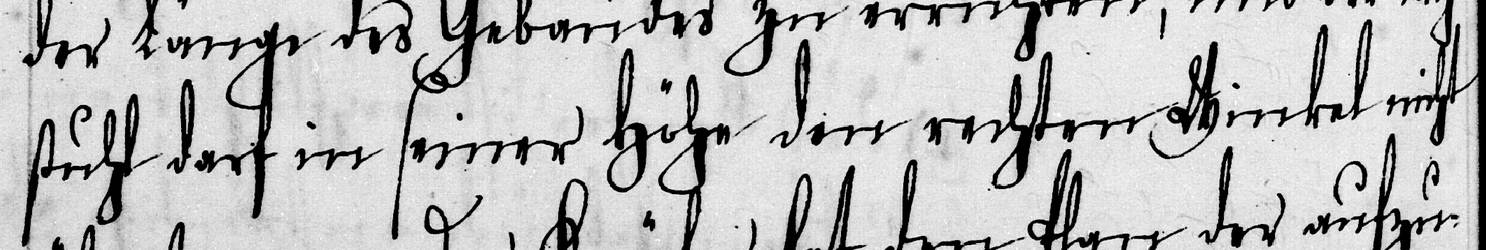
stuhl darf in seiner Höhe den rechten Winkel nicht
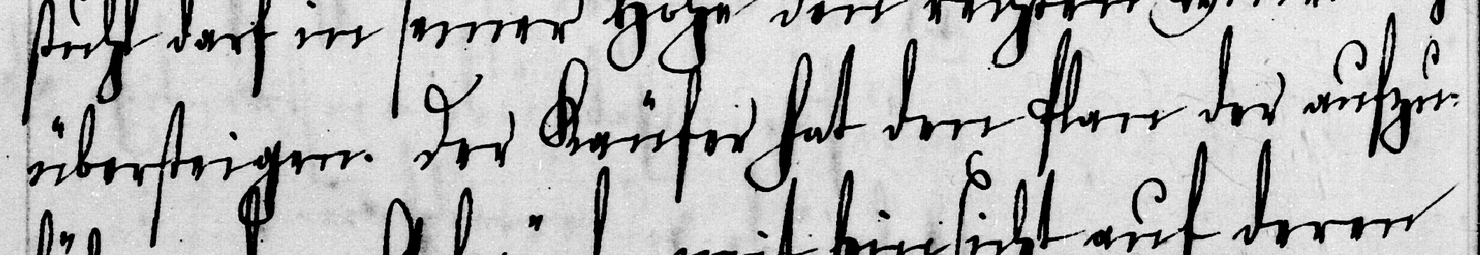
übersteigen. Der Käufer hat den Plan der aufzu¬
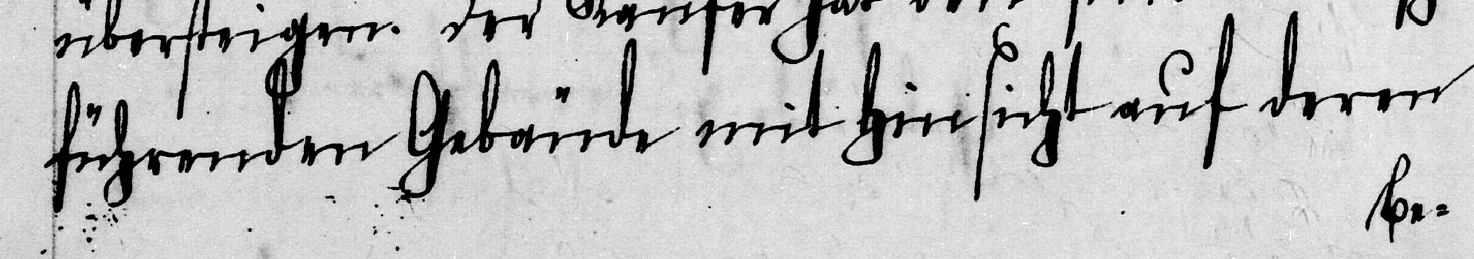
führenden Gebäude mit Hinsicht auf deren
